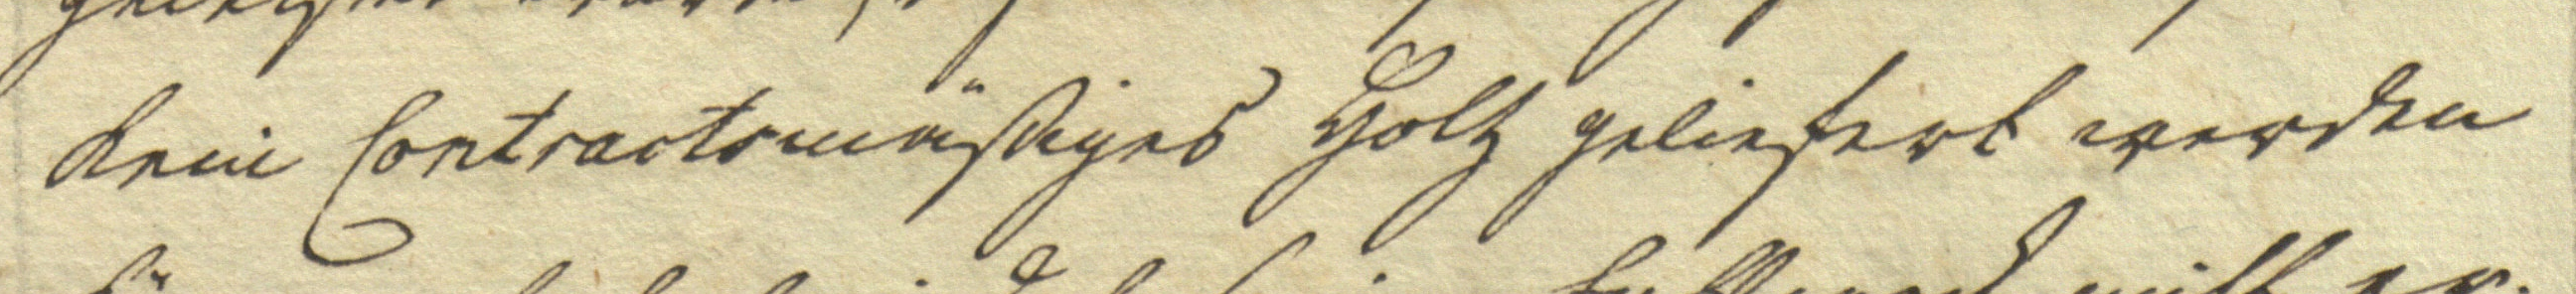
kein Contractsmäßiges Holz geliefert werden
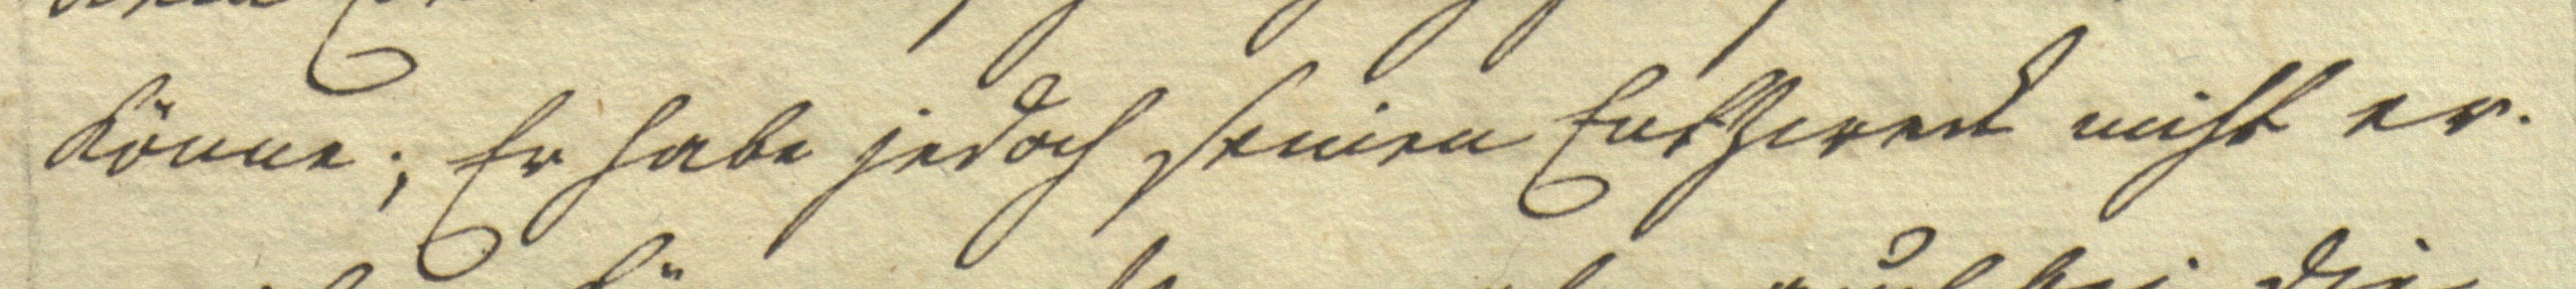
könne; Er habe jedoch seinen Entzweck nicht er¬
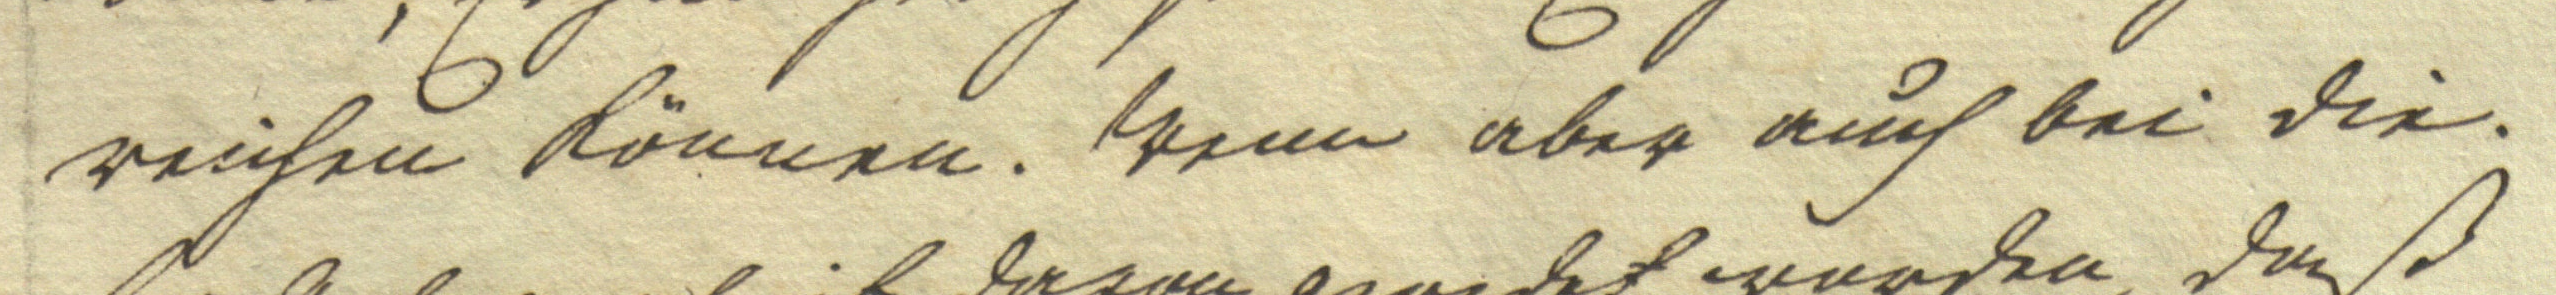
reichen können. Wenn aber auch bei die¬
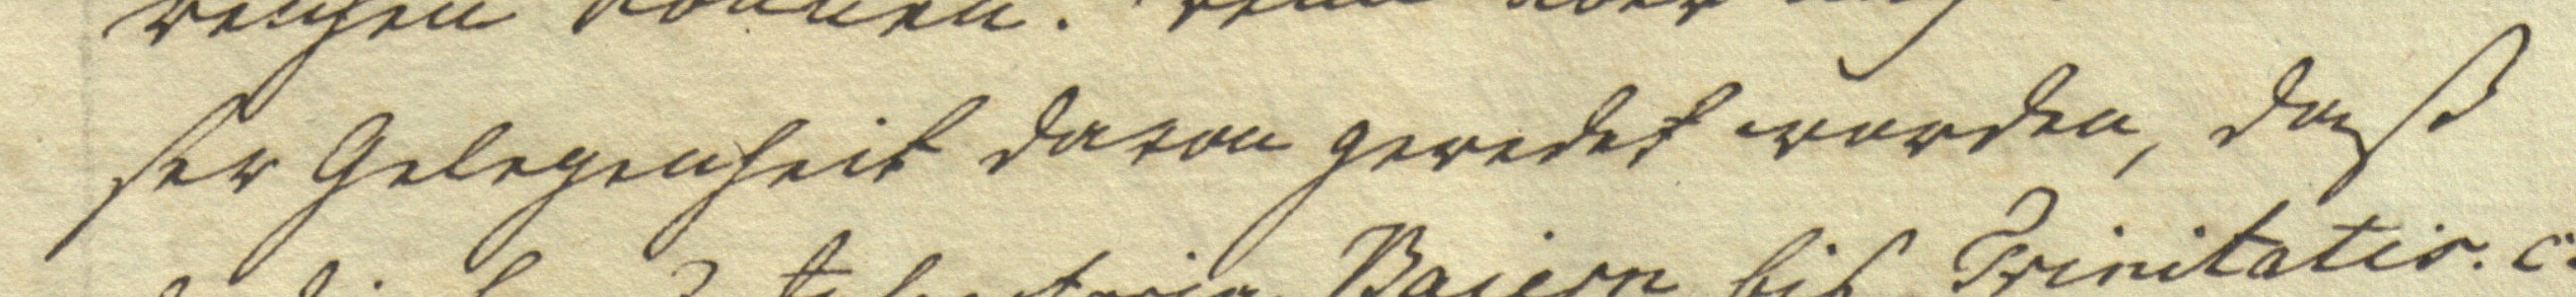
ser Gelegenheit davon geredet worden, daß
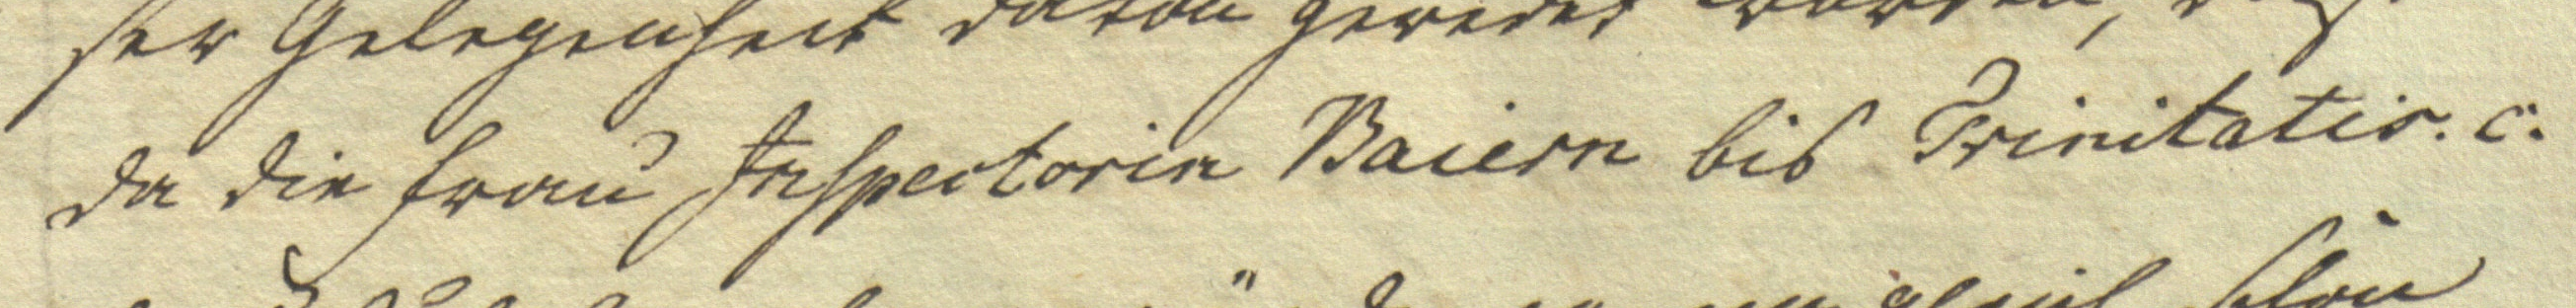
da die Frau Inspectoren Baiern bis Trinitatis. c.
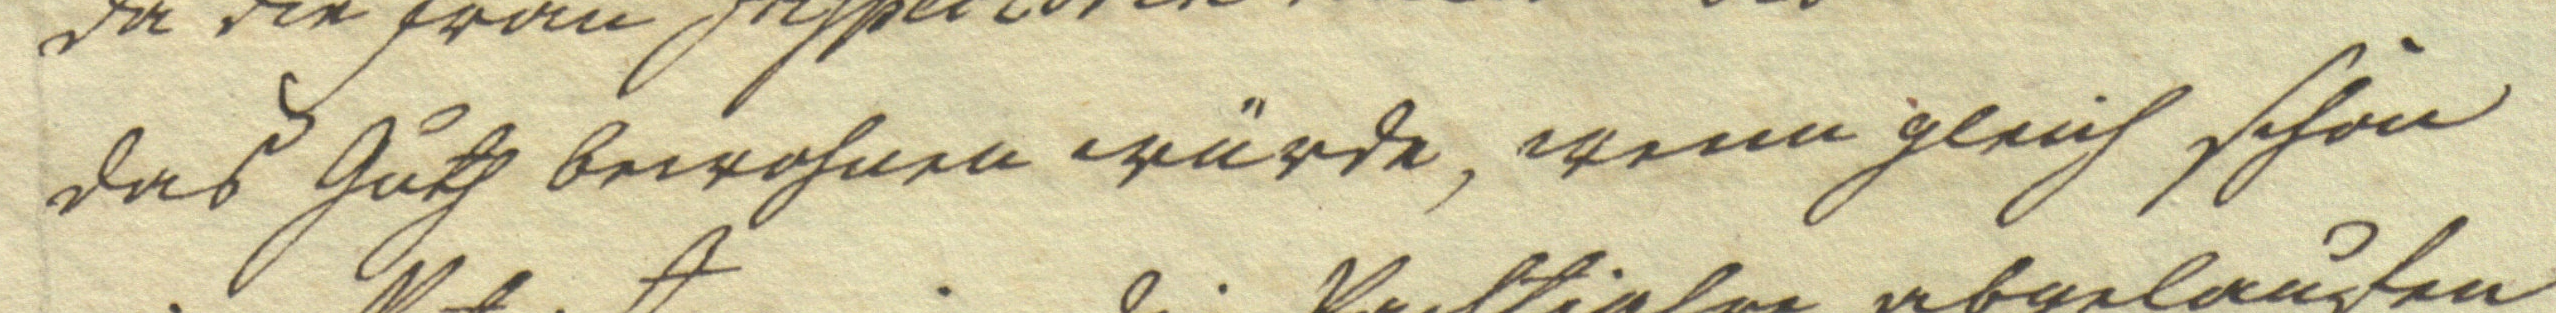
das Guth bewohnen würde, wenn gleich schon
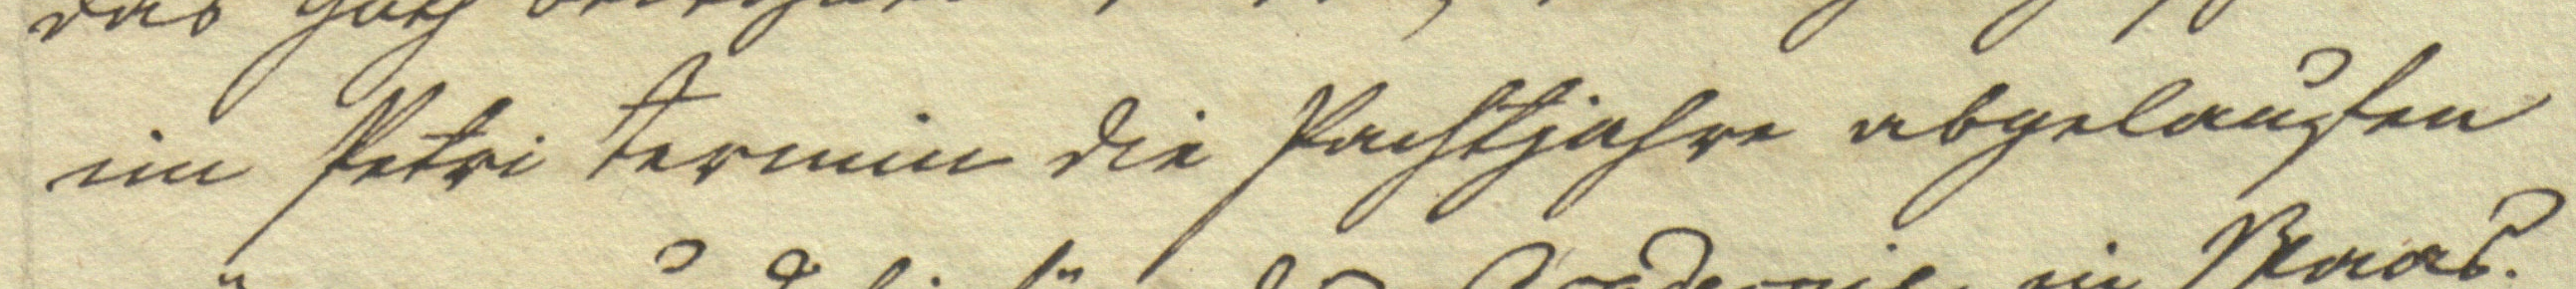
im Petri Termin die Pachtjahre abgelaufen
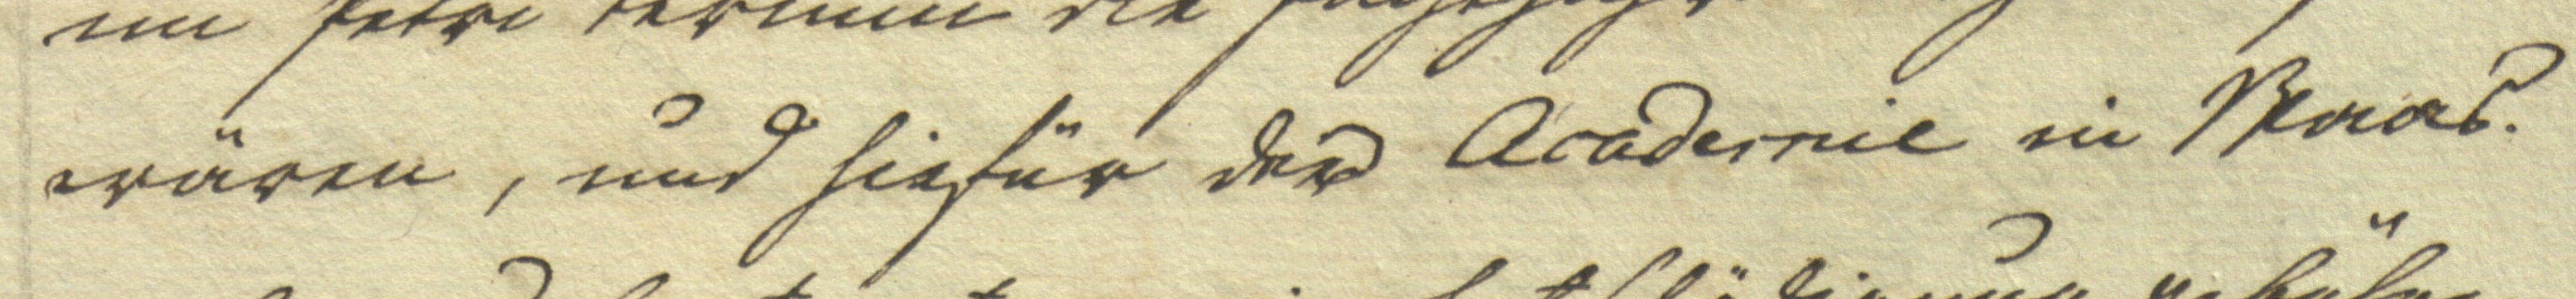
wären, und hiefür der Academie in Maas¬
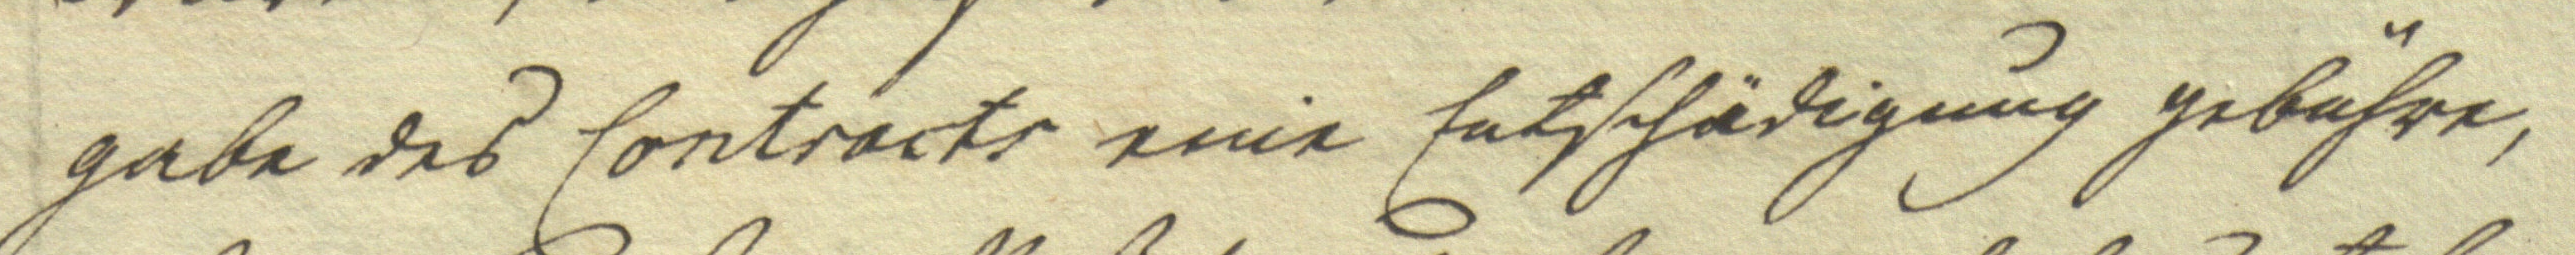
gabe des Contracts eine Entschädigung gebühre,
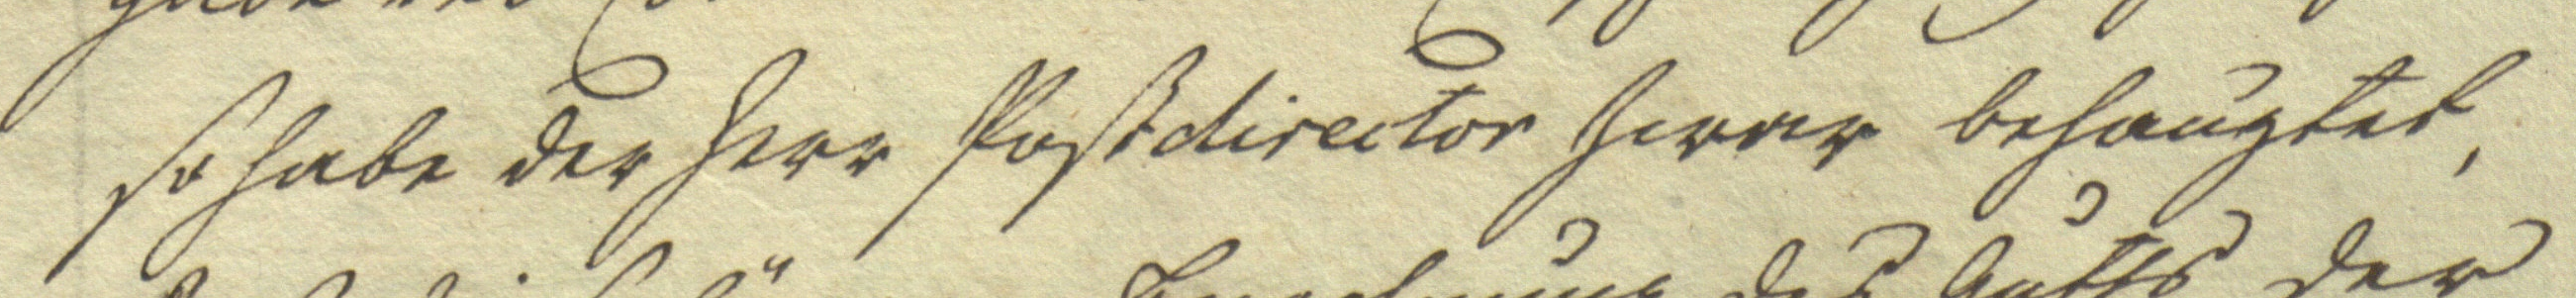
so habe der Herr Postdirector zwar behauptet,
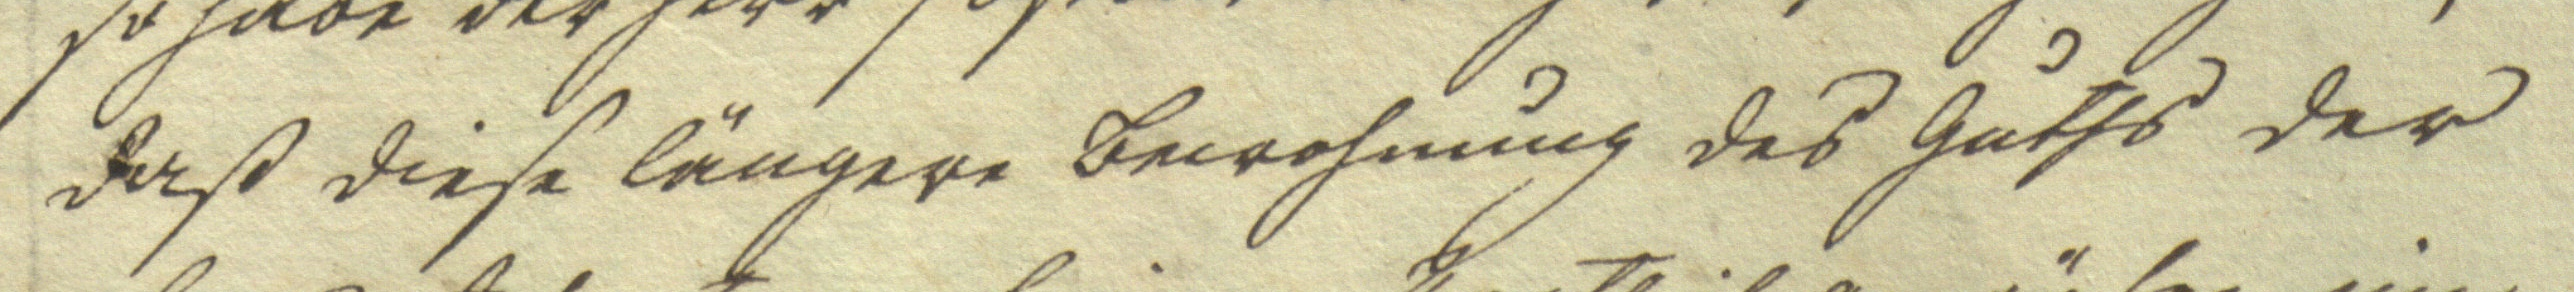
daß diese längere Bewohnung des Guths der
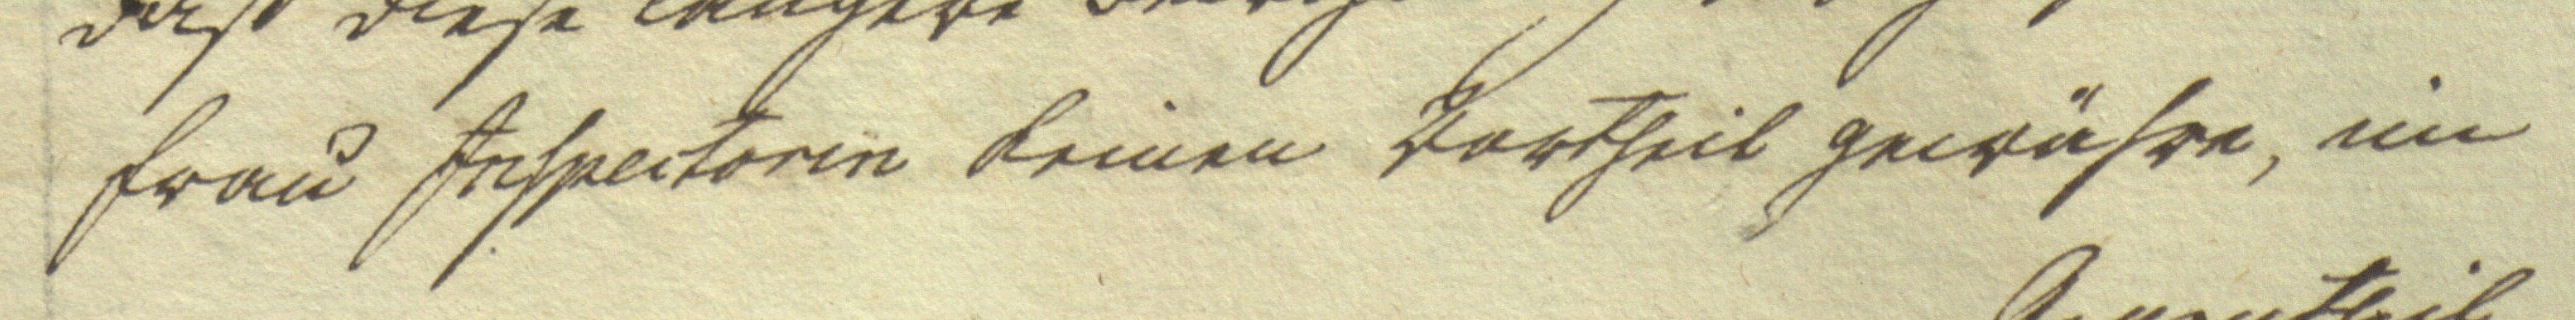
Frau Inspectorin keinen Vortheil gewähre, im
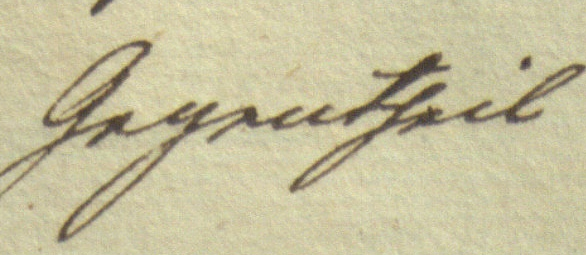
Gegentheil
